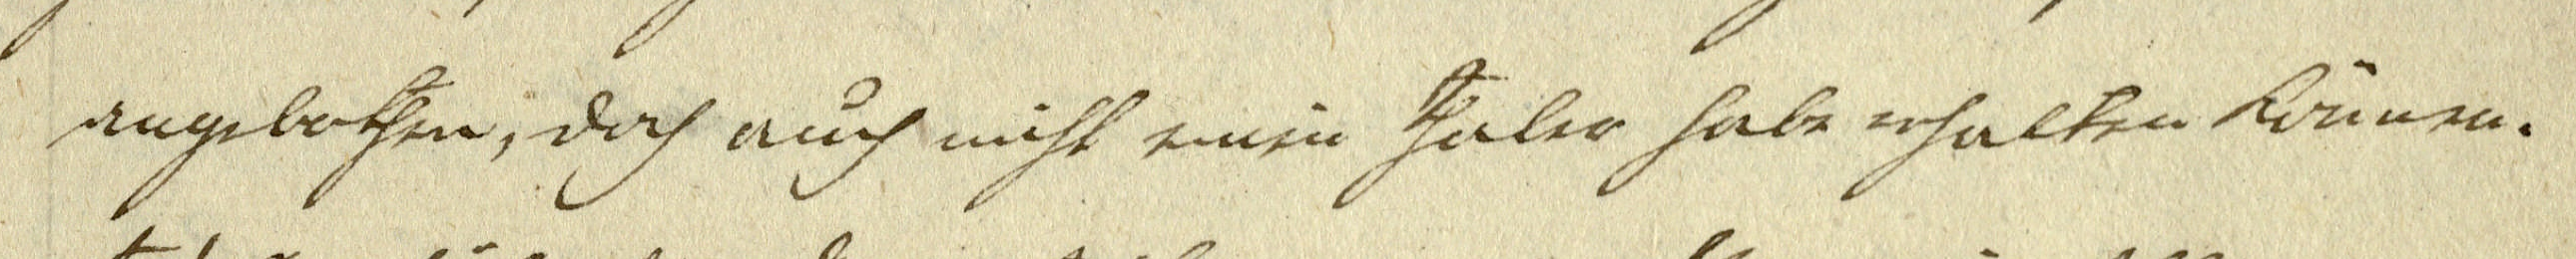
angebothen, doch auch nicht einen Thaler habe erhalten können.
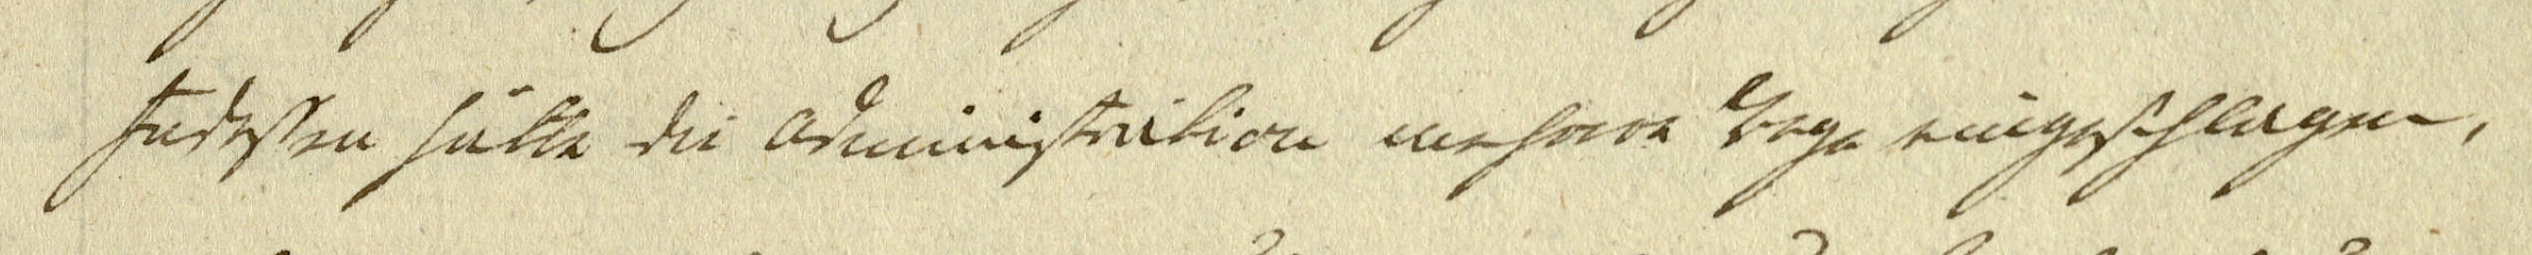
Indessen hätte die Administration mehrere Wege eingeschlagen,
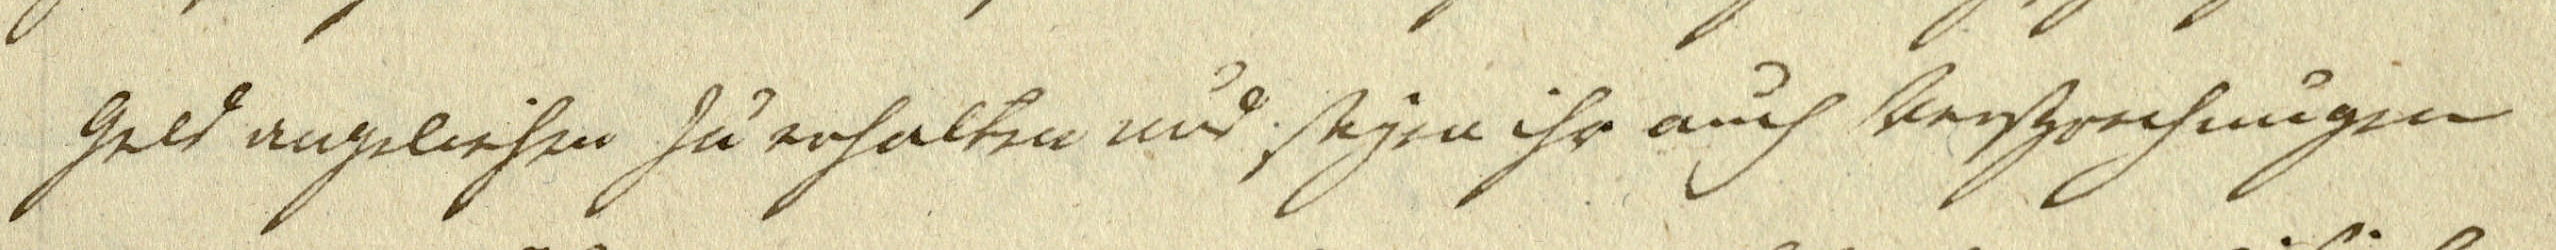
Geld angeliehen zu erhalten und seÿen ihr auch Versprechungen
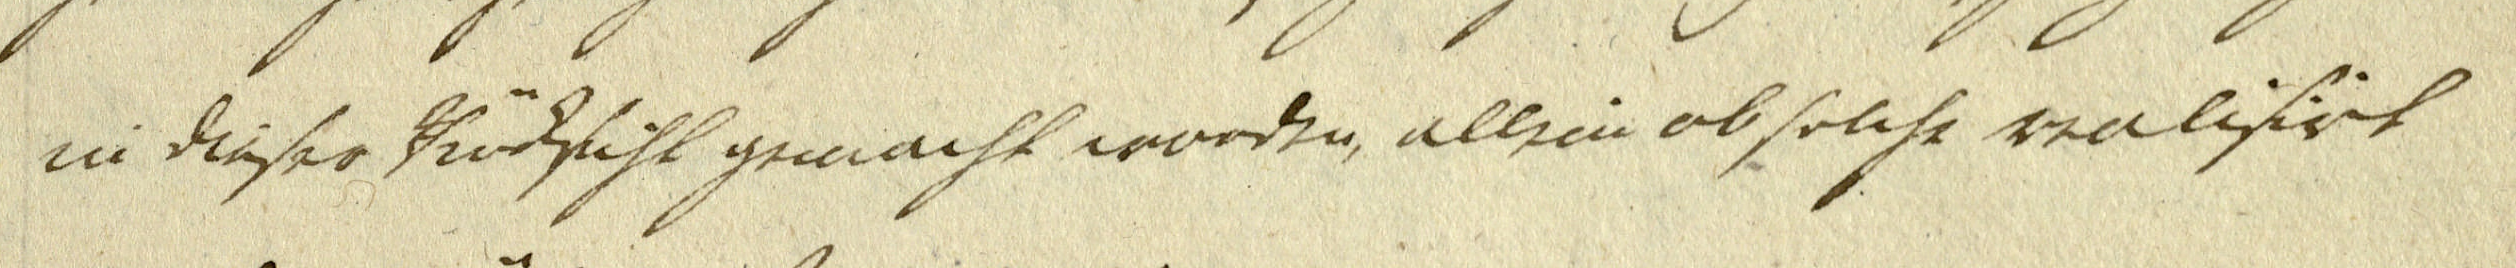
in dieser Rücksicht gemacht worden, allein ob solche realisirt
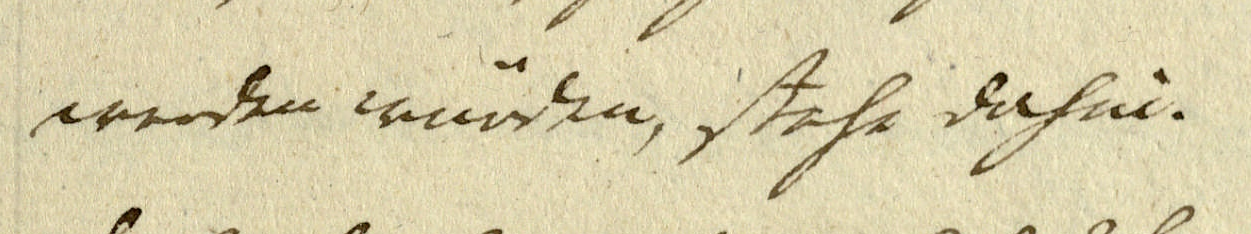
werden würden, stehe dahin.
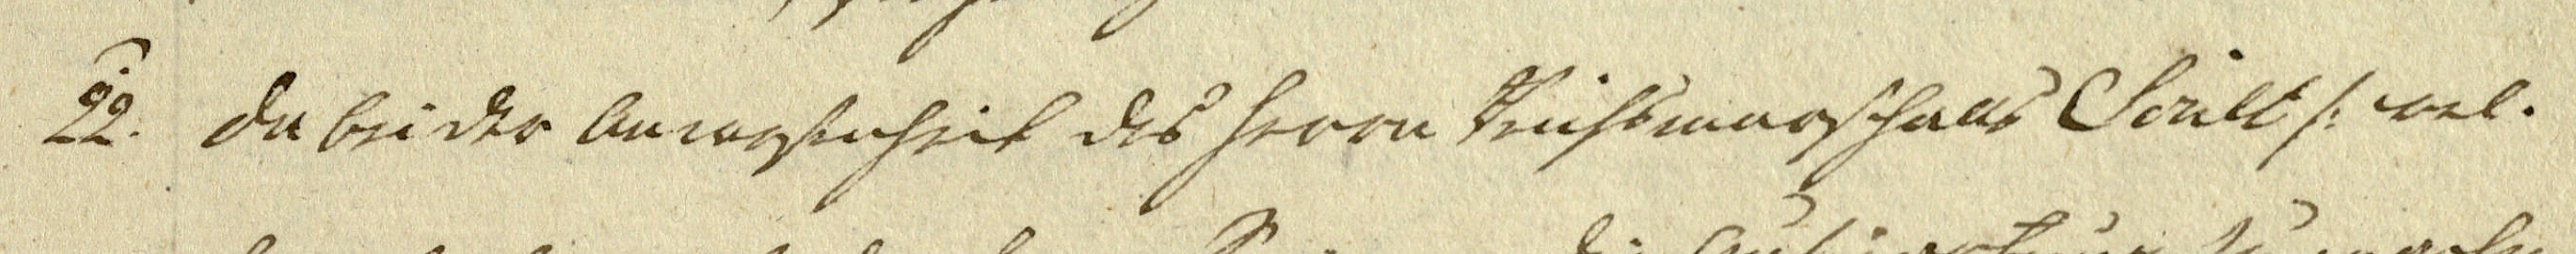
22. Da bei der Anwesenheit des Herrn Reichsmarschalls Soult /: wel¬
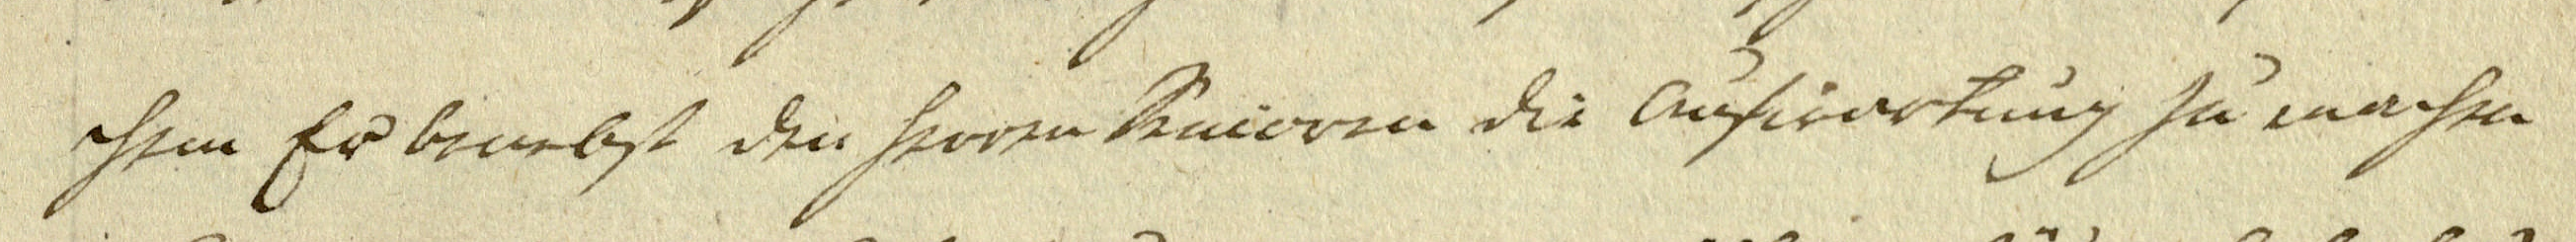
chem Er benebst den Herren Senioren die Aufwartung zu machen
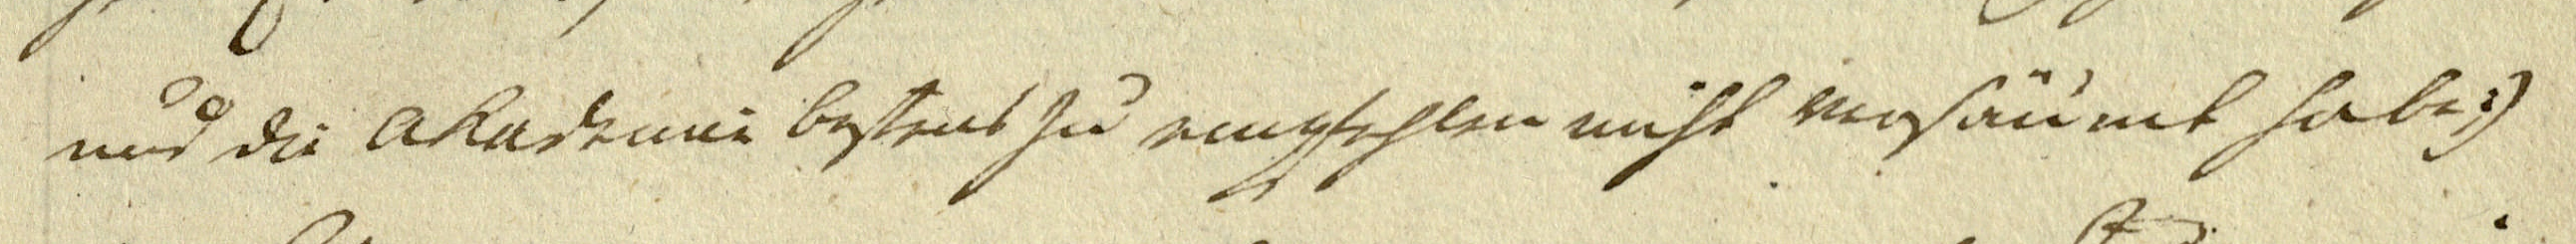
und die Akademie bestens zu empfehlen nicht versäumt habe :/
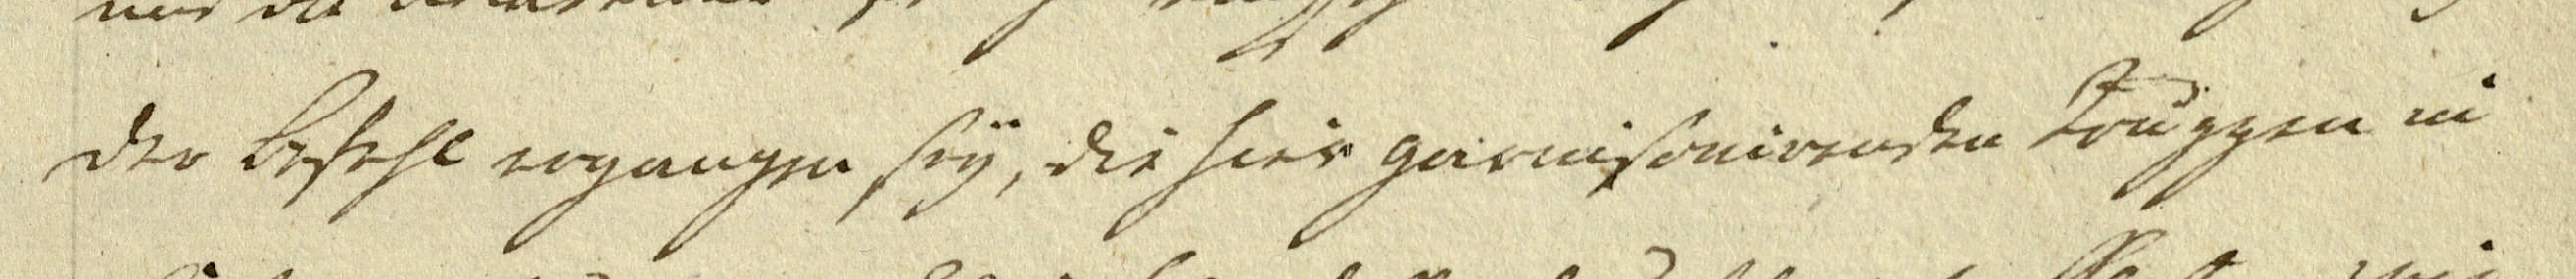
der Befehl ergangen seÿ, die hier garnisonirenden Truppen in
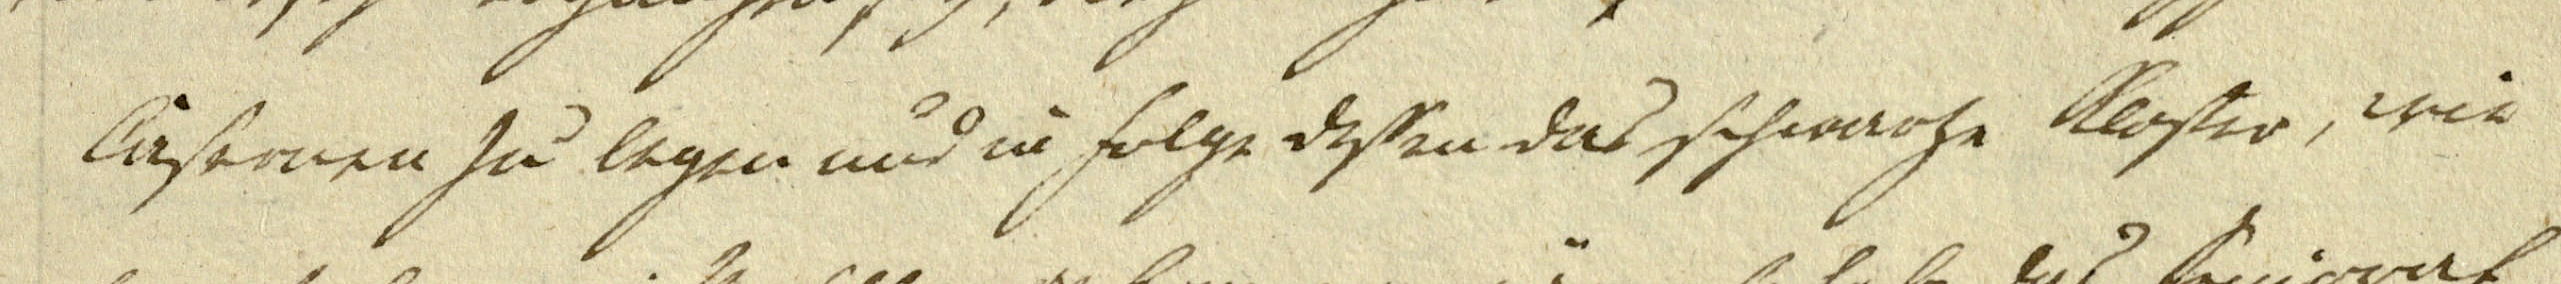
Casernen zu legen und in Folge dessen das schwarze Kloster, wie
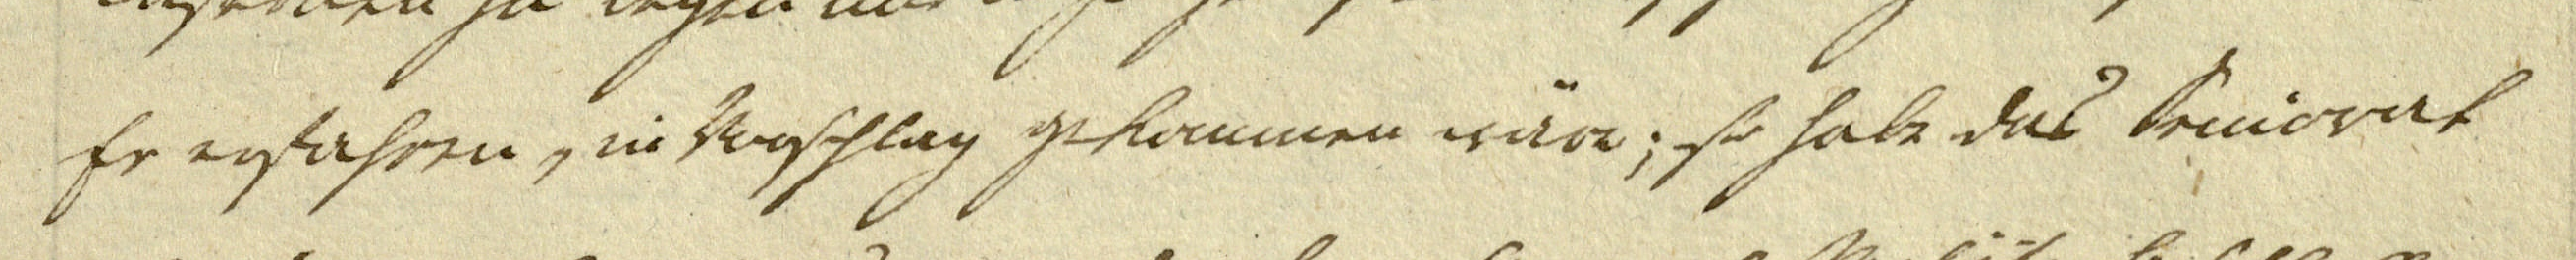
Er erfahren, in Vorschlag gekommen wäre; so habe das Seniorat
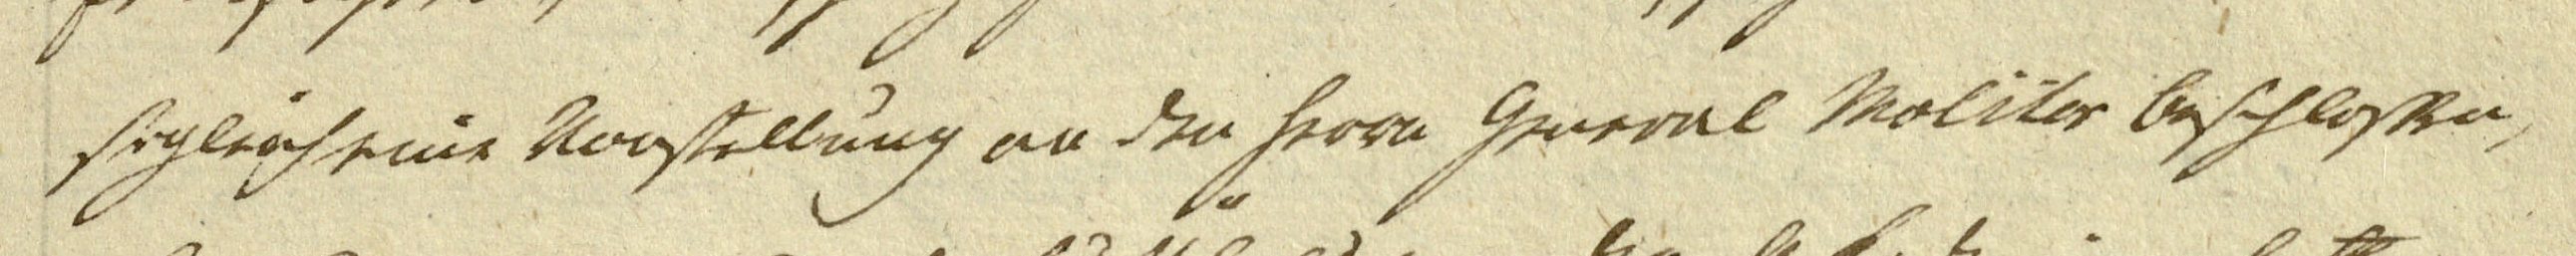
sogleich eine Vorstellung an den Herrn General Molitor beschlossen,
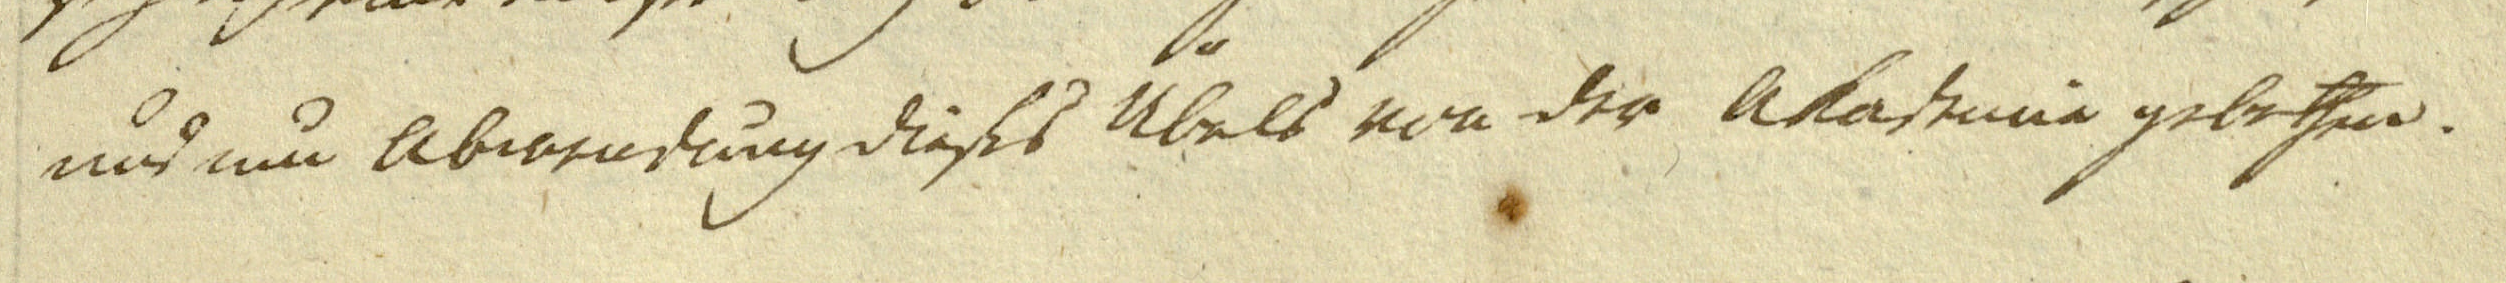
und um Abwendung dieses Übels von der Akademie gebethen.
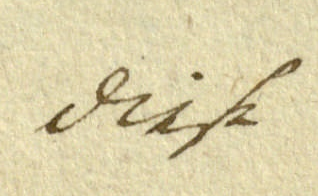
Diese
